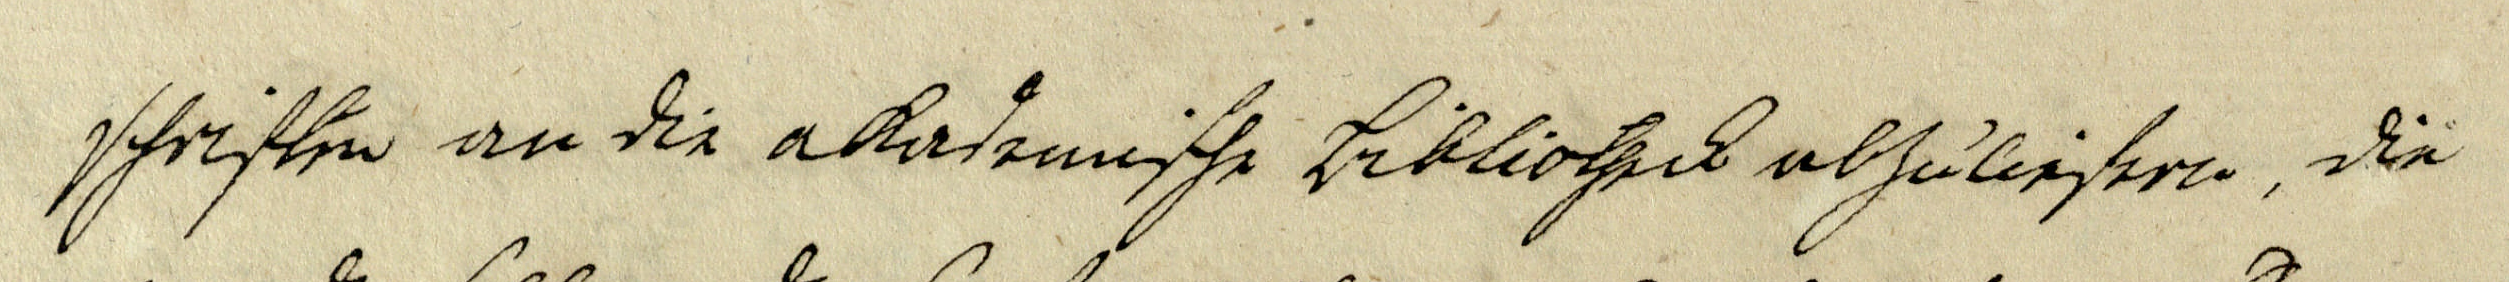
schriften an die akademische Bibliotheck abzuliefern, die
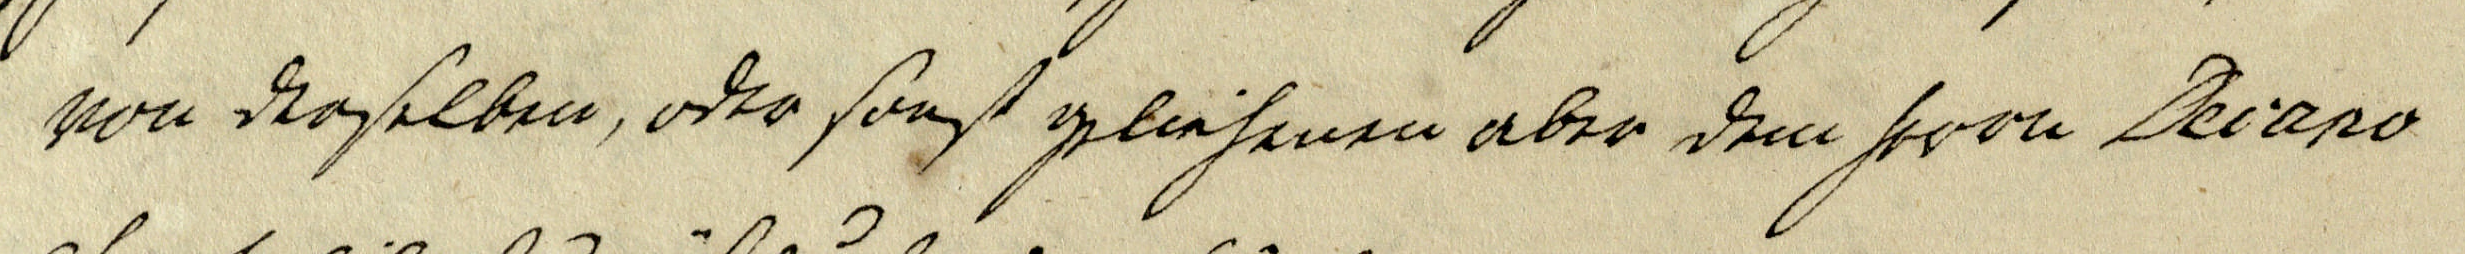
von derselben, oder sonst geliehenen aber dem Herrn Decano
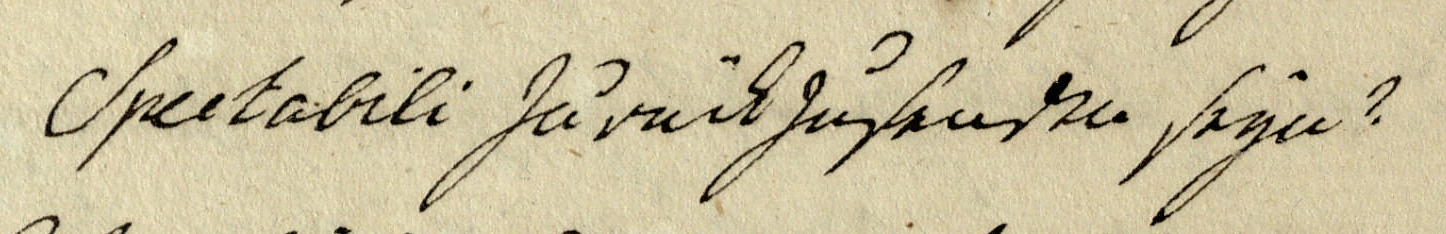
Spectabili zurück zusenden seÿn?
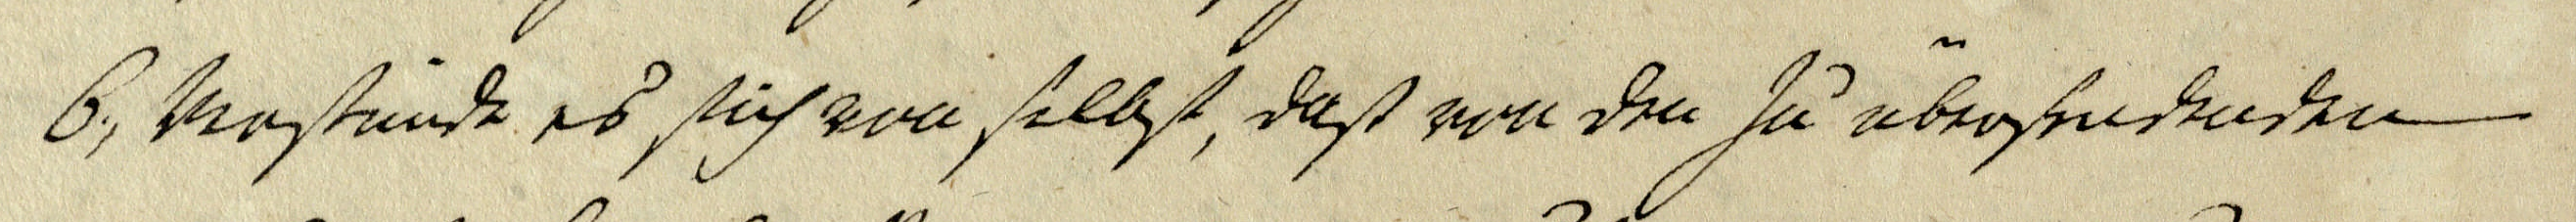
6, Verstünde es sich von selbst, daß von den zu übersendenden
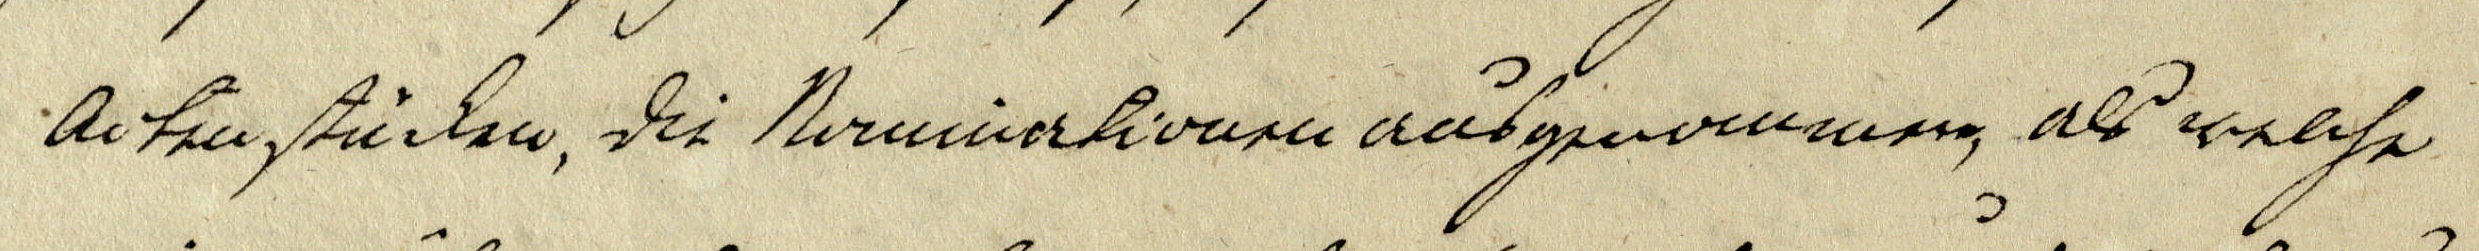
Actenstücken, die Nominationen ausgenommen, als welche
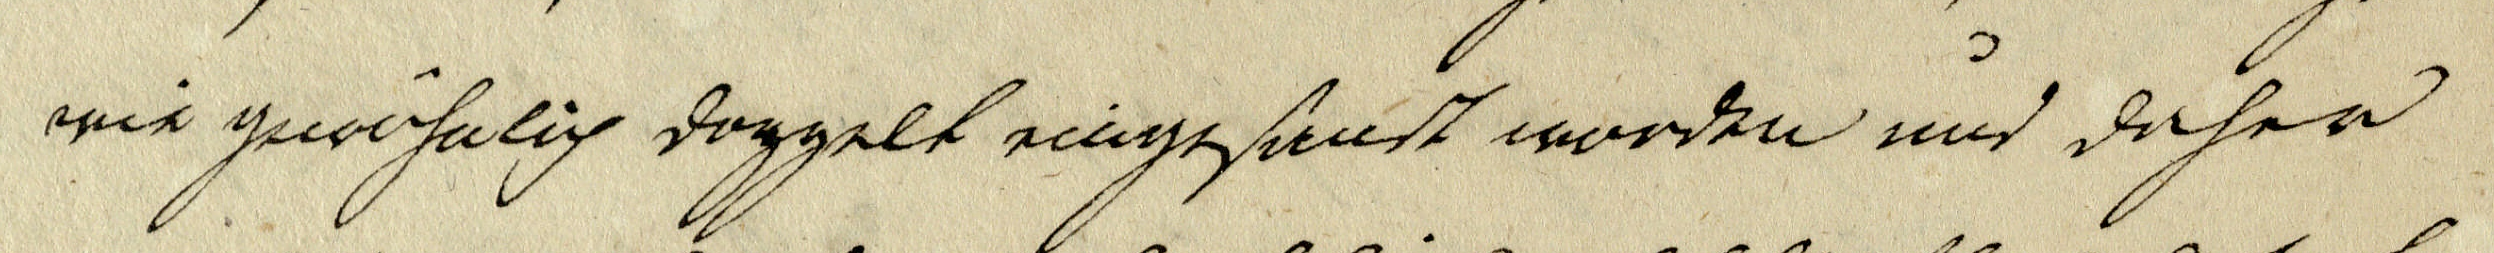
wie gewöhnlich doppelt eingesandt worden und daher
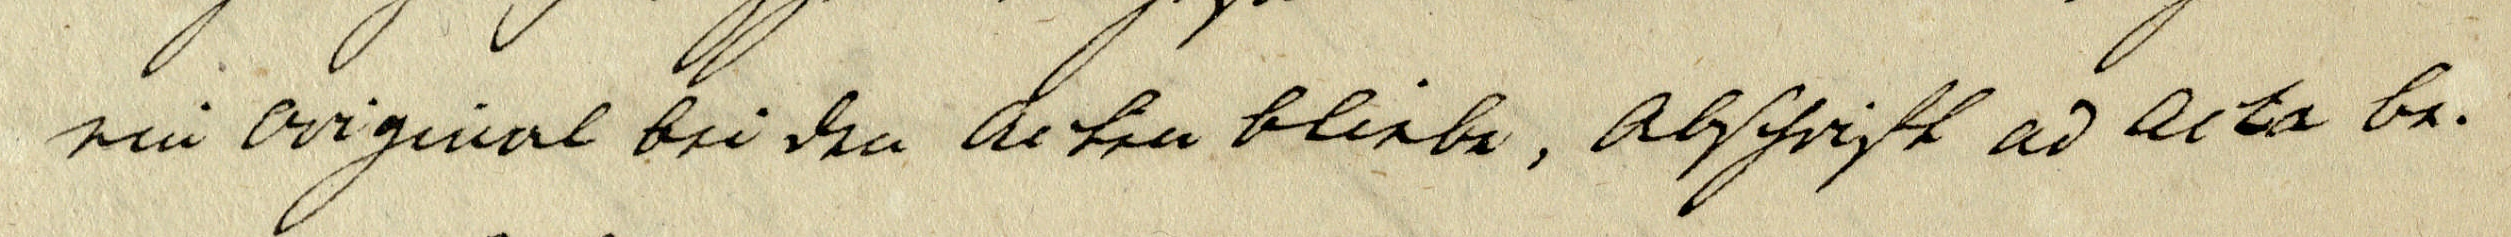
ein Original bei den Acten bliebe, Abschrift ad Acta be¬
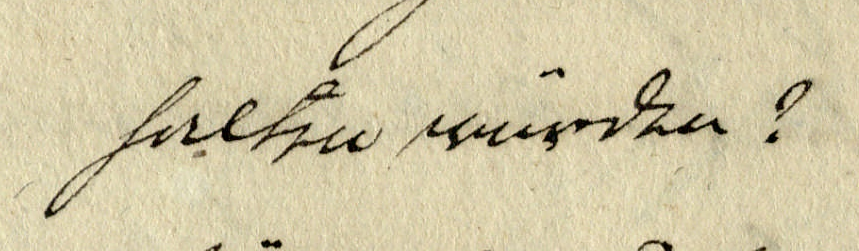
halten würden?
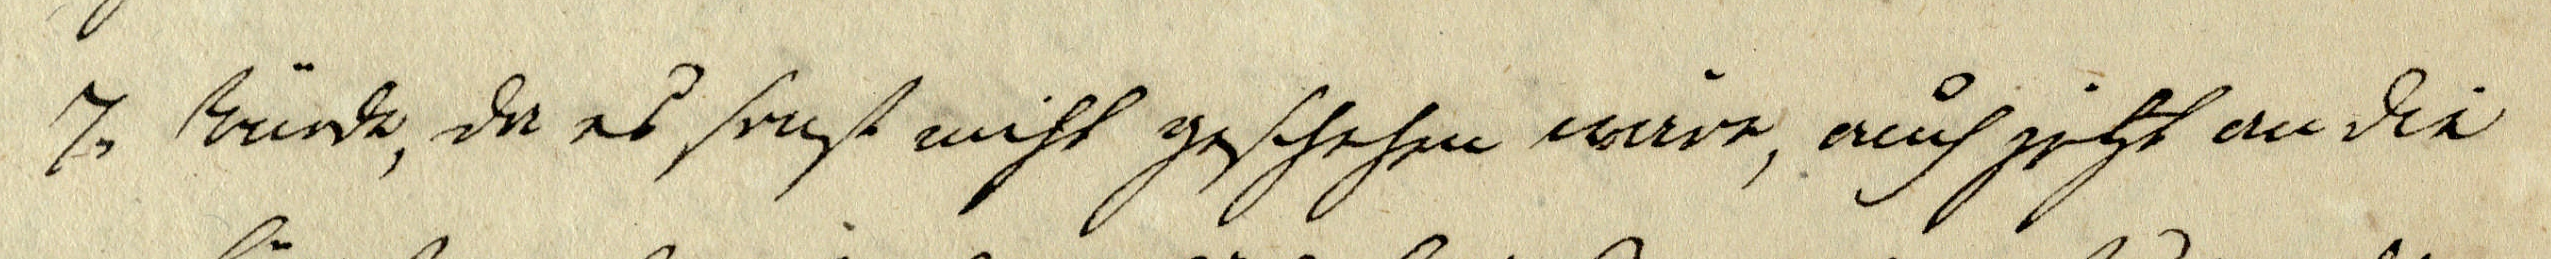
7. Würde, da es sonst nicht geschehen wäre, auch jetzt an die
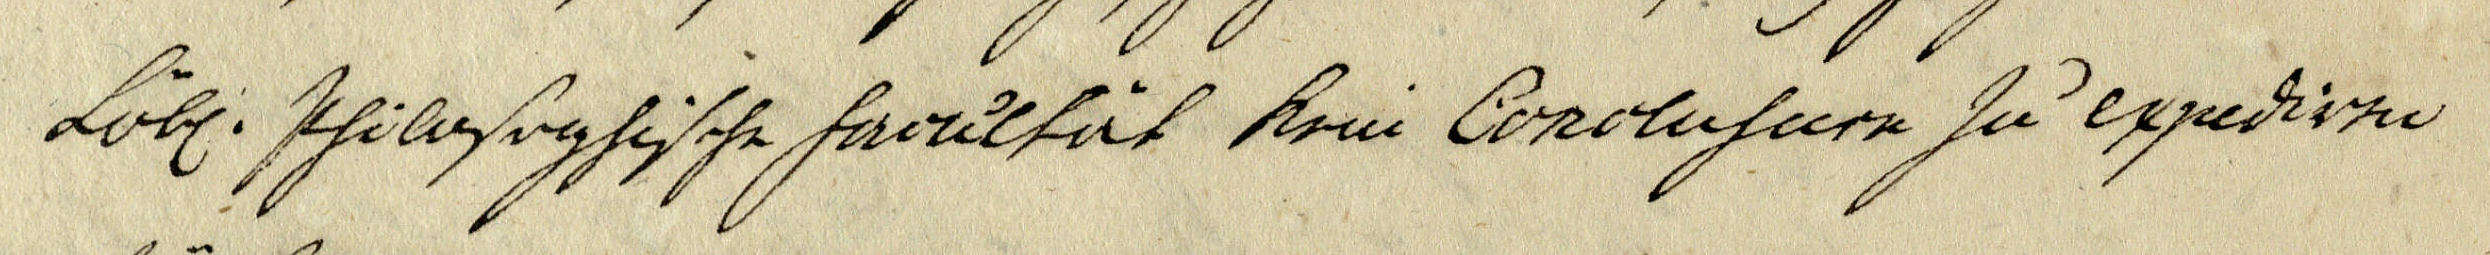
Löbl. Philosophische Facultät kein Conclusum zu expediren
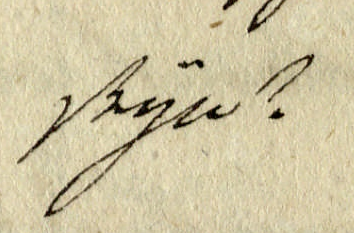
seÿn?
